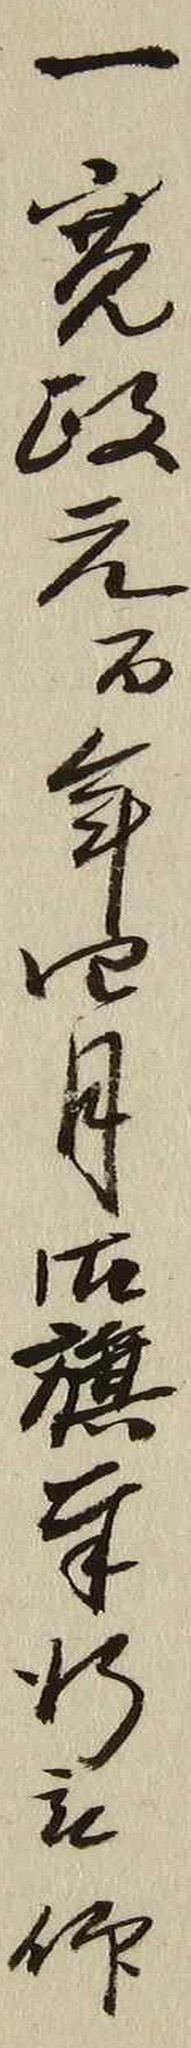一寛政元酉年四月御旗奉行被仰
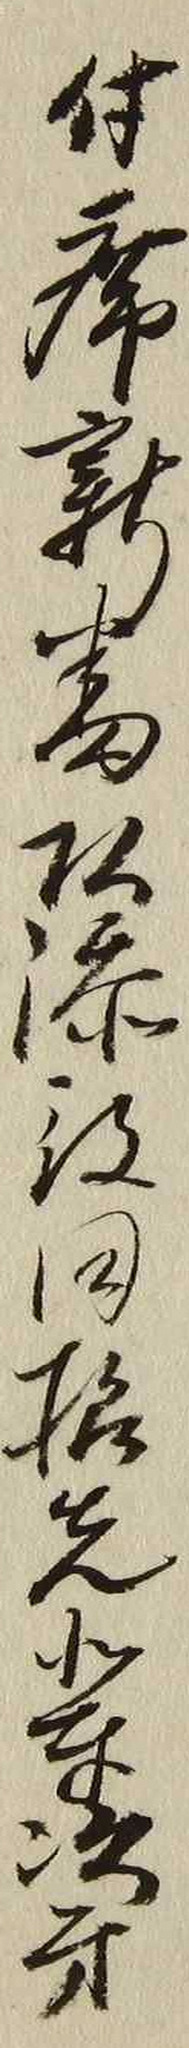付席新番頭添役同格先輩次第
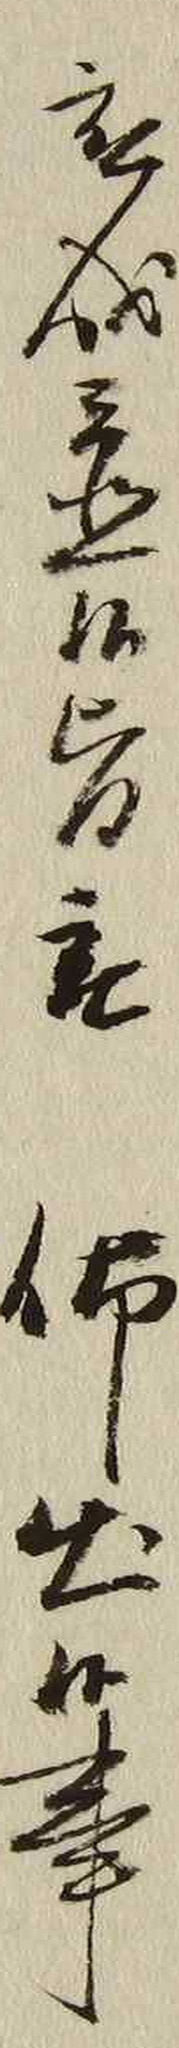被成置候旨被仰出候事
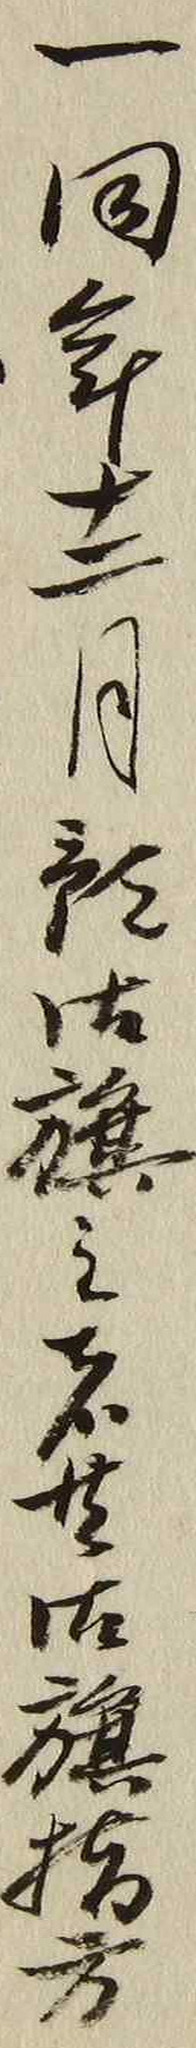一同年十二月預御旗之者共御旗指方
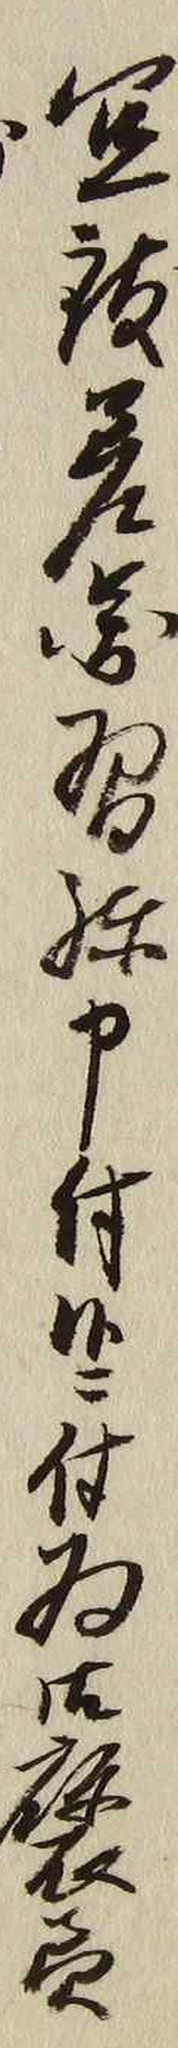宜致差図習練申付候ニ付為御褒美
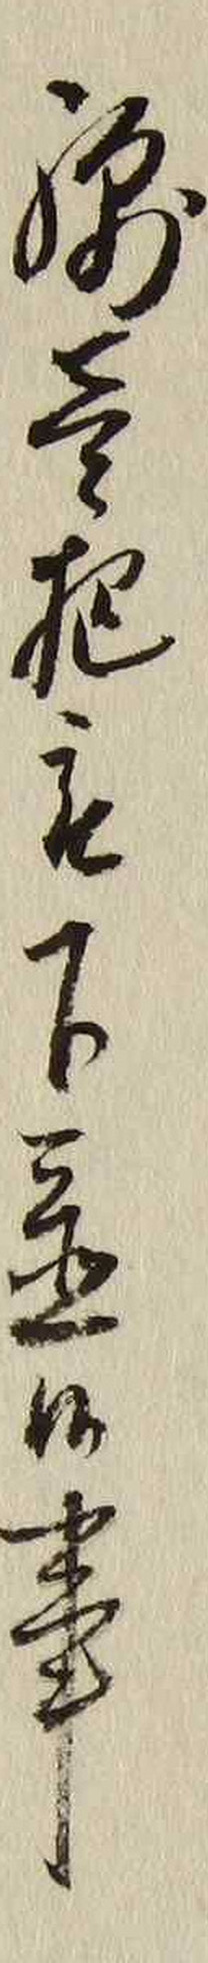綿壱把被下置候事
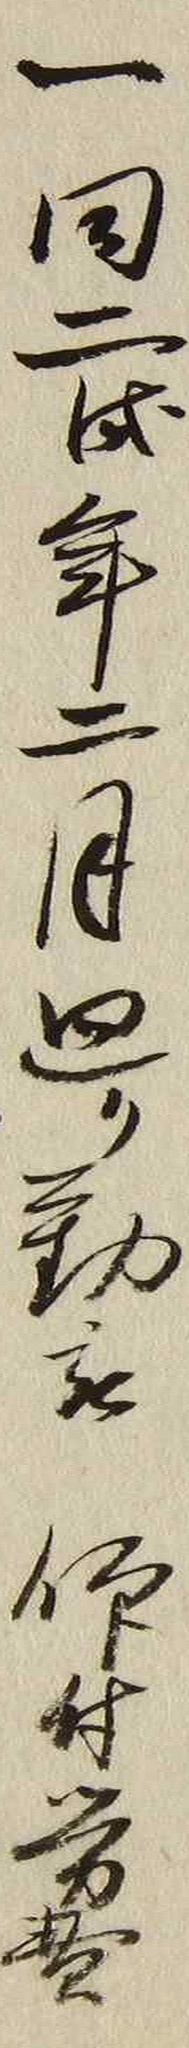一同二戌年二月廻り勤被仰付労費
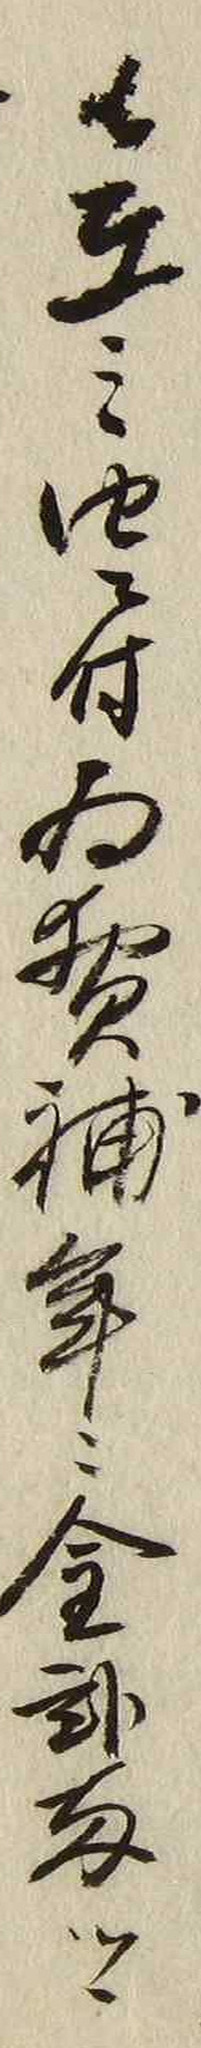も在之由ニ付為費補年々金弐両ツヽ
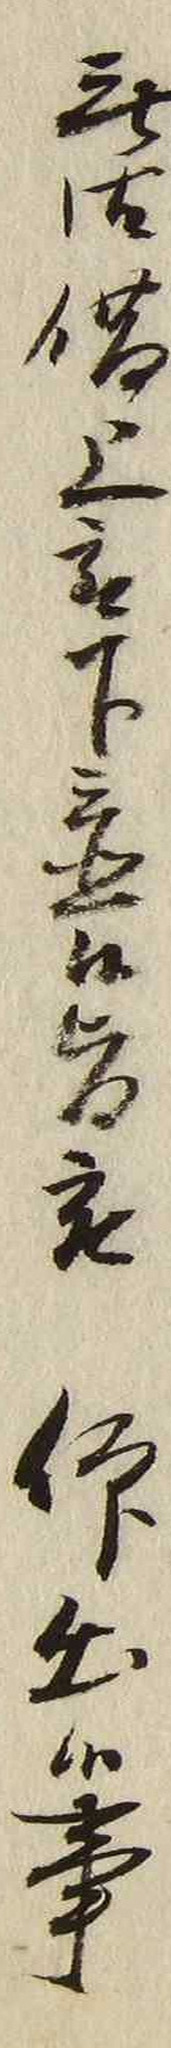無御借上被下置候旨被仰出候事

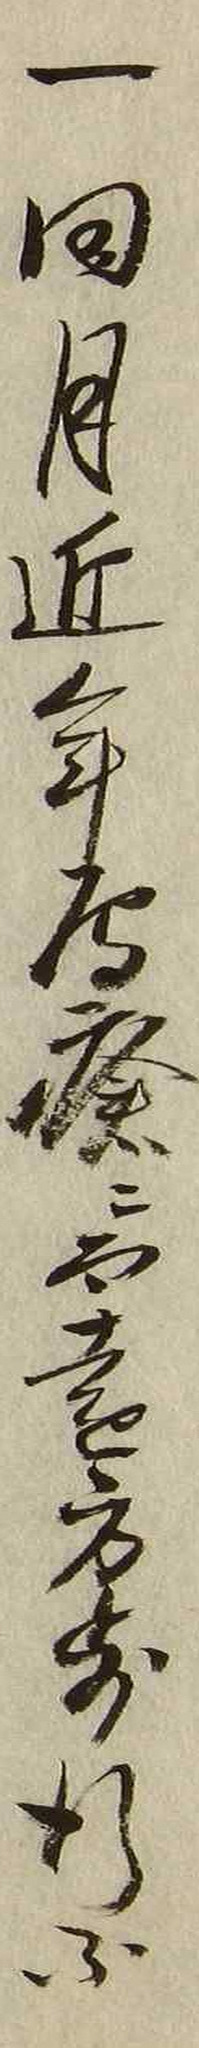一同月近年雁瘡ニ而遠方歩行不
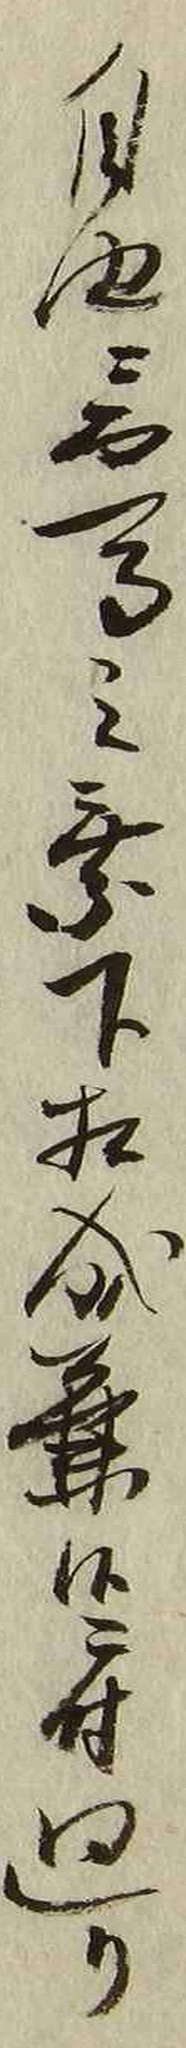自由ニ而馬之乗下相成兼候ニ付廻り
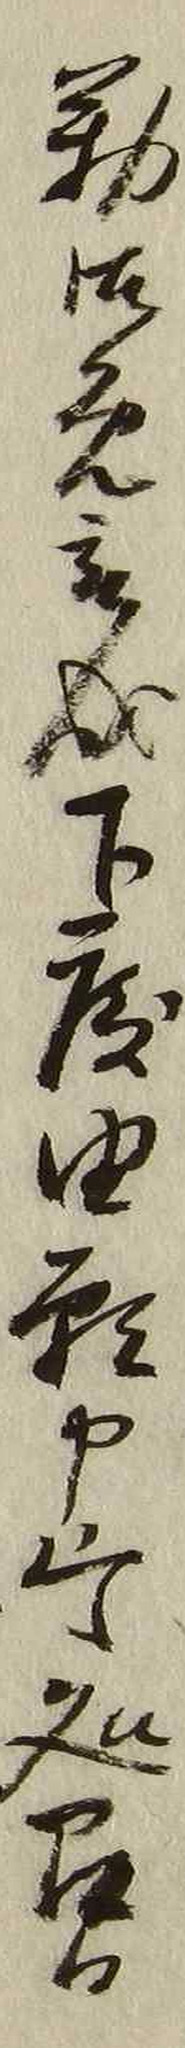勤御免被成下度由願申上候処即日
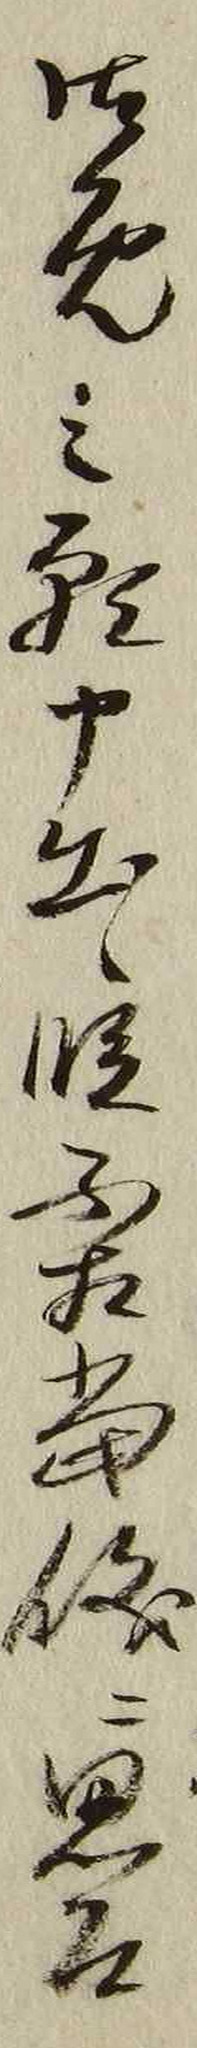御免之願申出候段不相当儀ニ思召
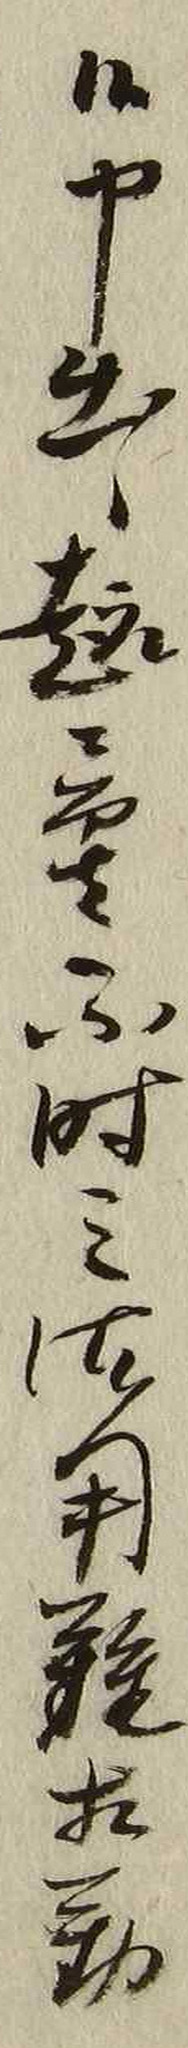候申出候趣ニ而者不時之御用難相勤
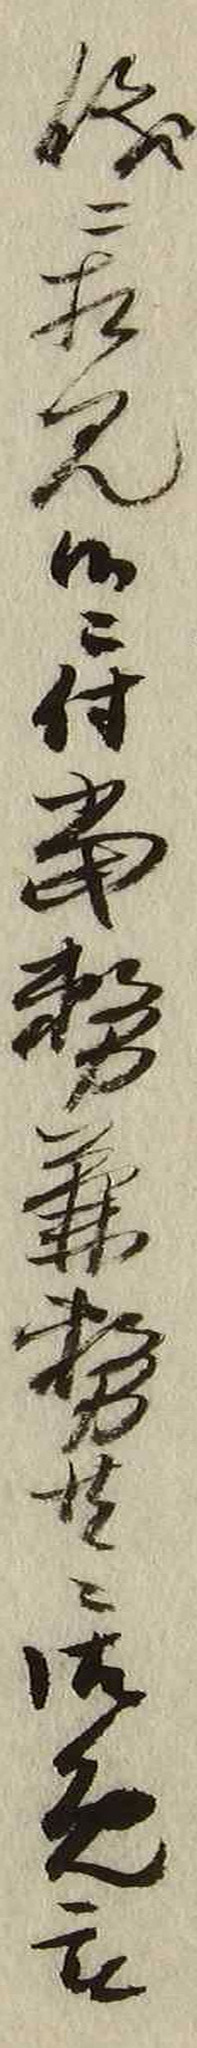儀ニ相見候ニ付当務兼務共ニ御免被
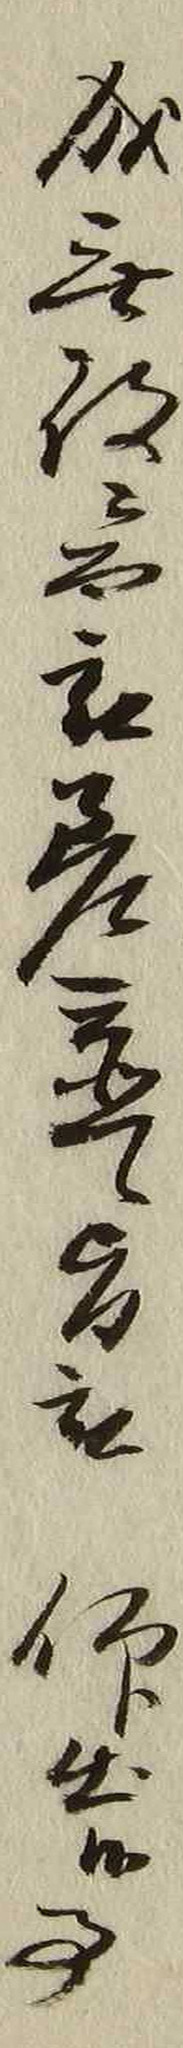成無役ニ而被差置候旨被仰出候事
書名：諸士系譜　巻之356　す之部6
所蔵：会津若松市立会津図書館
